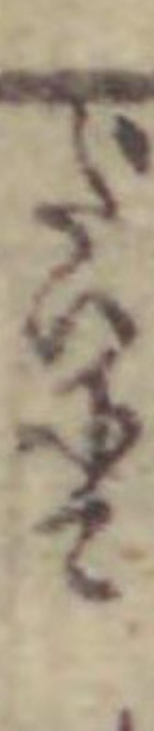たいにて
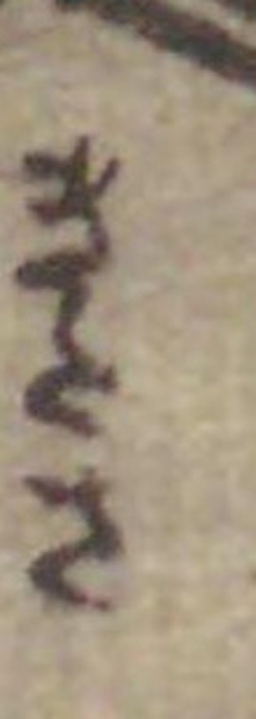またさ
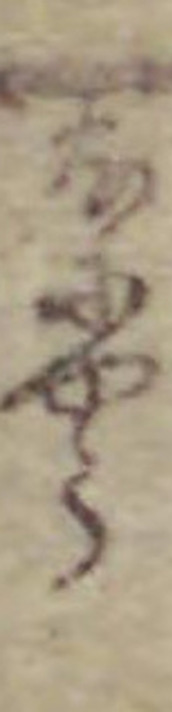なにやら
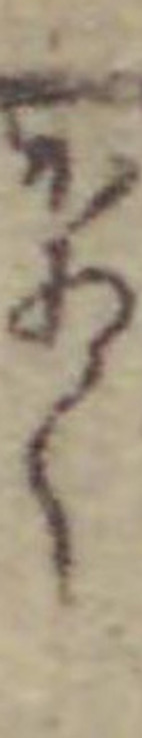かあ〳〵
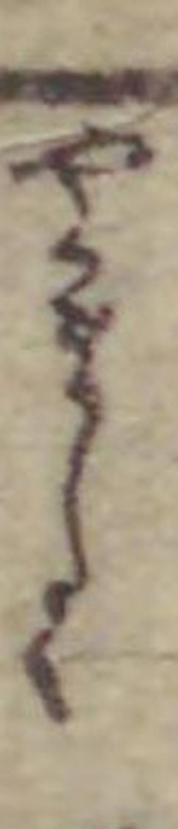やかましく
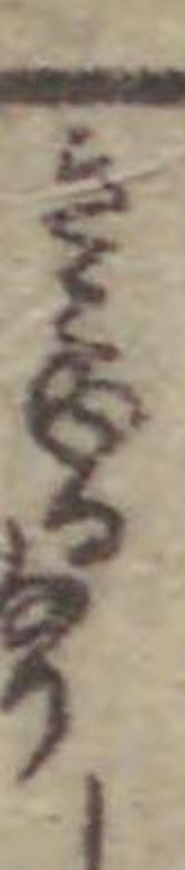きこゆるなり
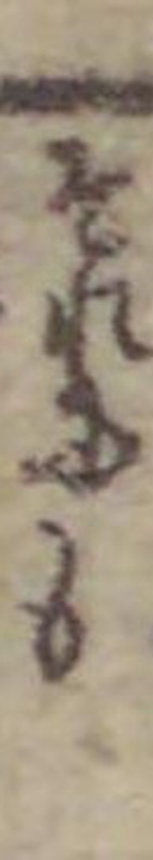それにも
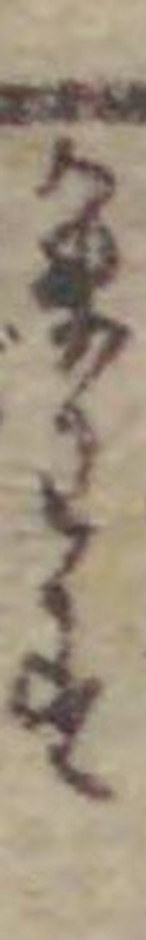かまわす
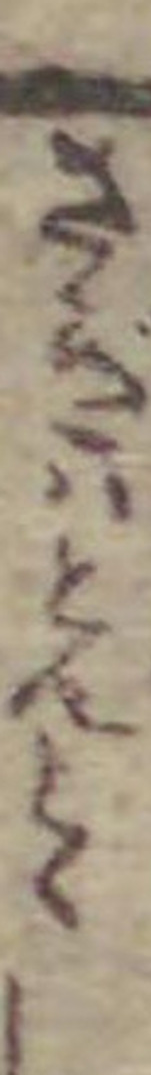さぎはとんと
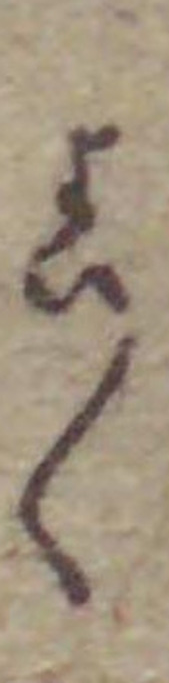よい〳〵
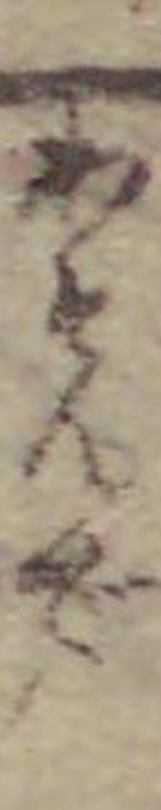あそんで
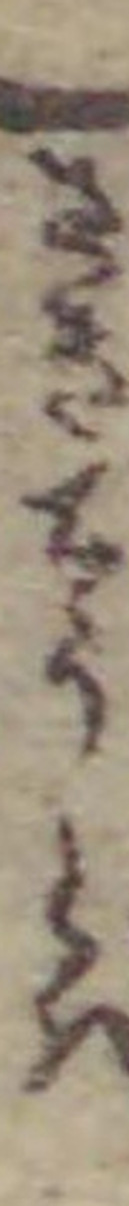さきてうとハ
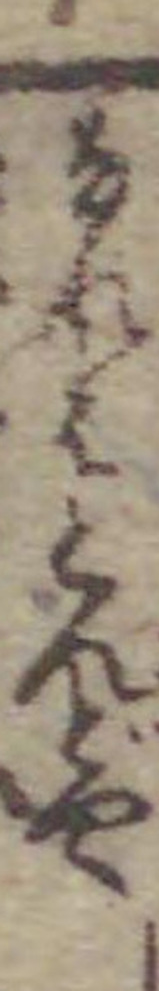なれはとんどや
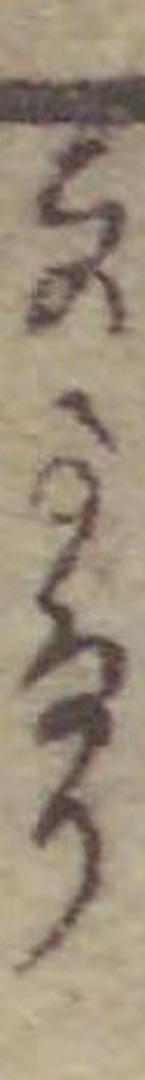この事なり

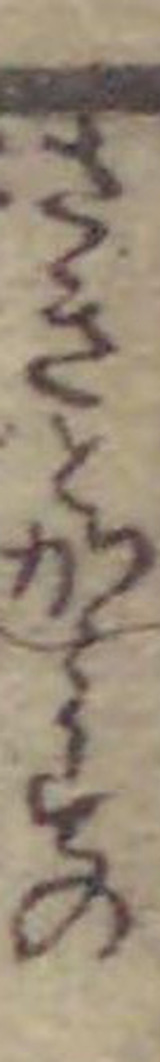さきとからすの
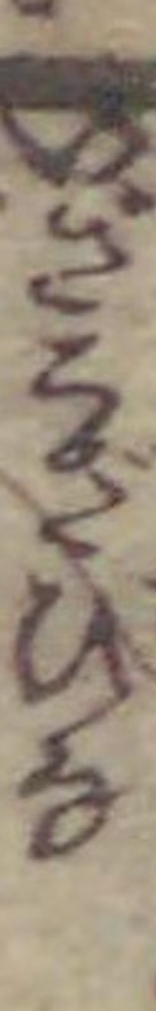いざこざひな
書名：烏行水諺草 3巻
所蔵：国立国会図書館 National Diet Library, JAPAN
